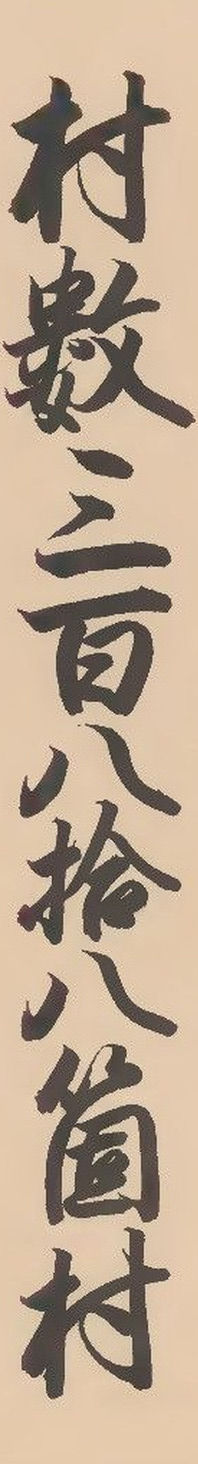村数三百八拾八箇村
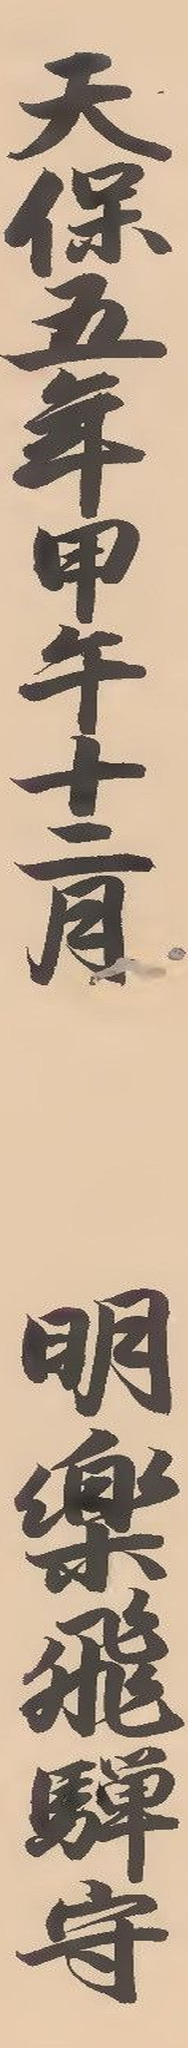天保五年甲午十二月明楽飛騨守
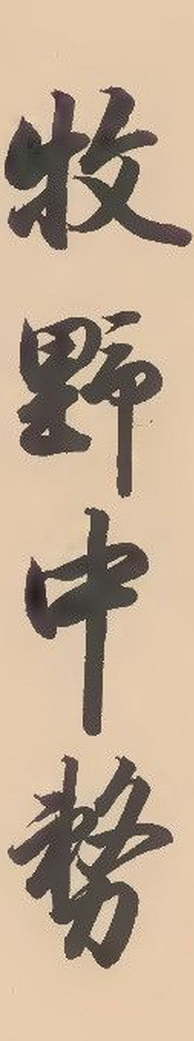牧野中務
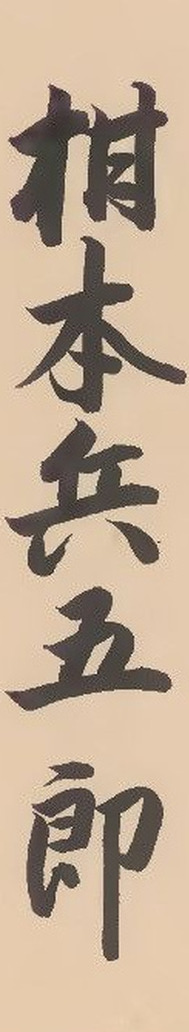柑本兵五郎
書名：丹後国郷帳
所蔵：国立公文書館 National Archives of Japan
